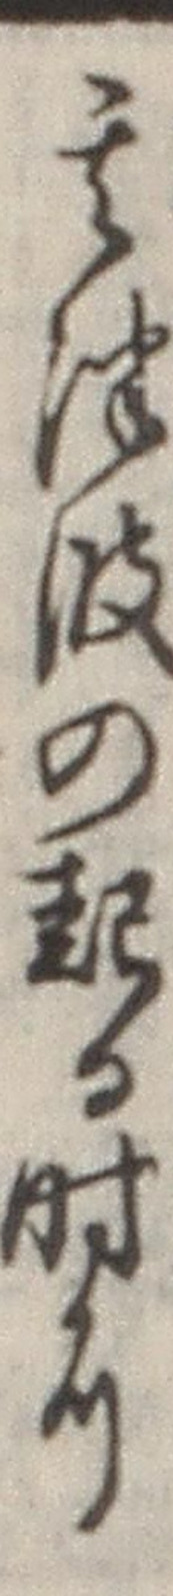其津波の起る時に
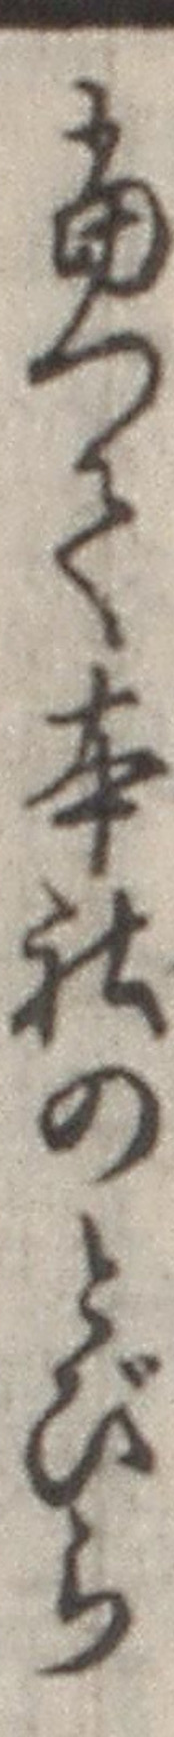当つて本社のとびら
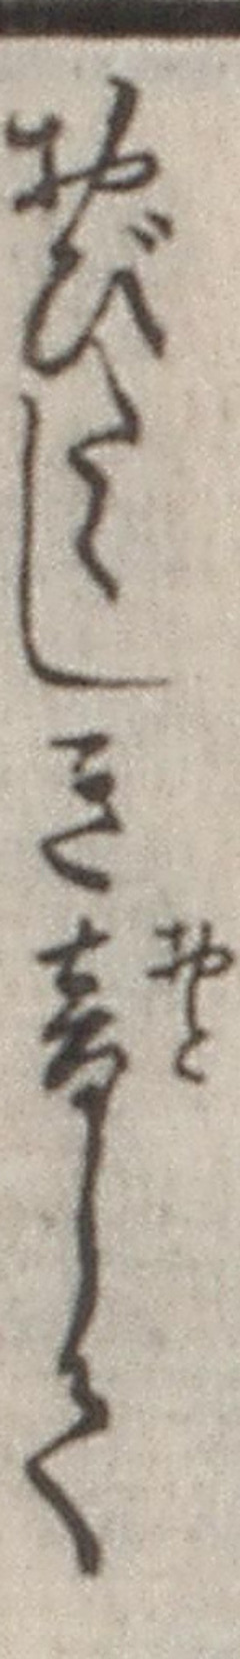おびたゝしき音して
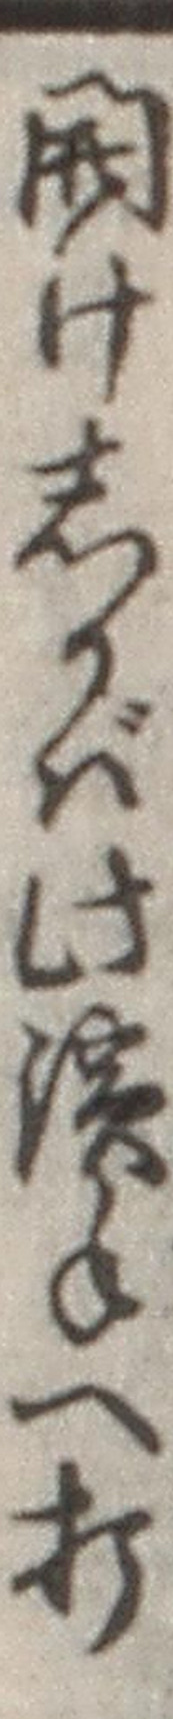開けしかば此浜手へ打
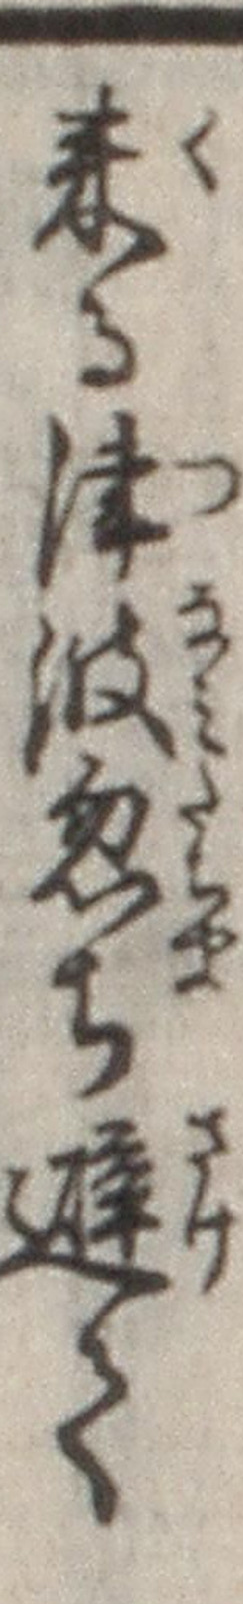来る津波忽ち避て
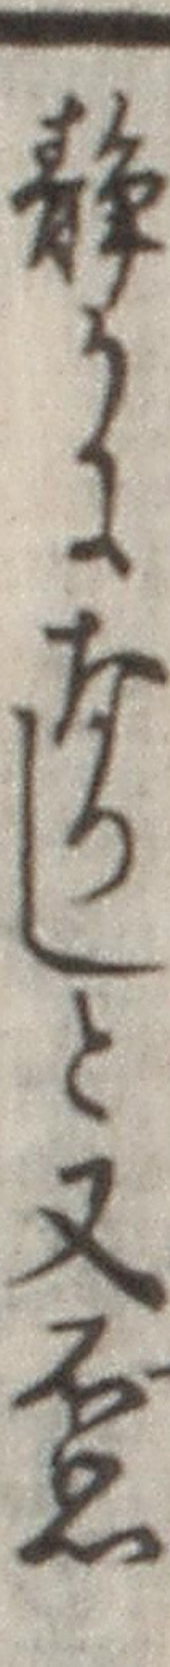静かになりしと又不思
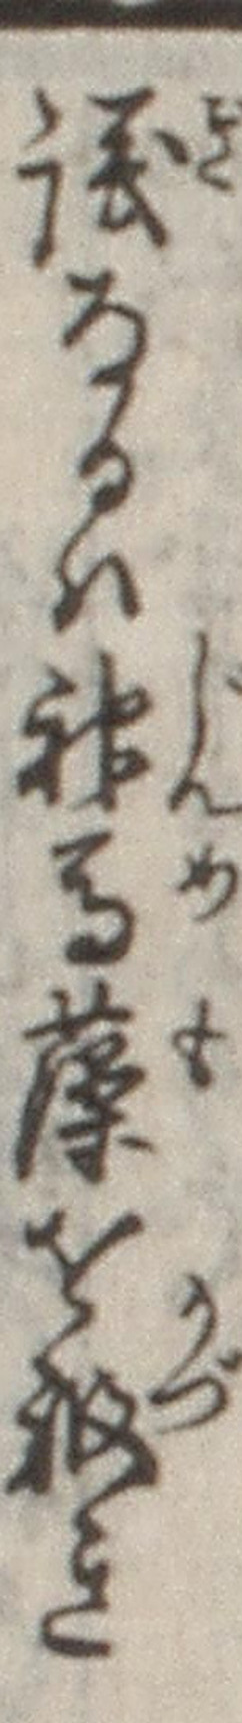議なるは神馬藻を被き
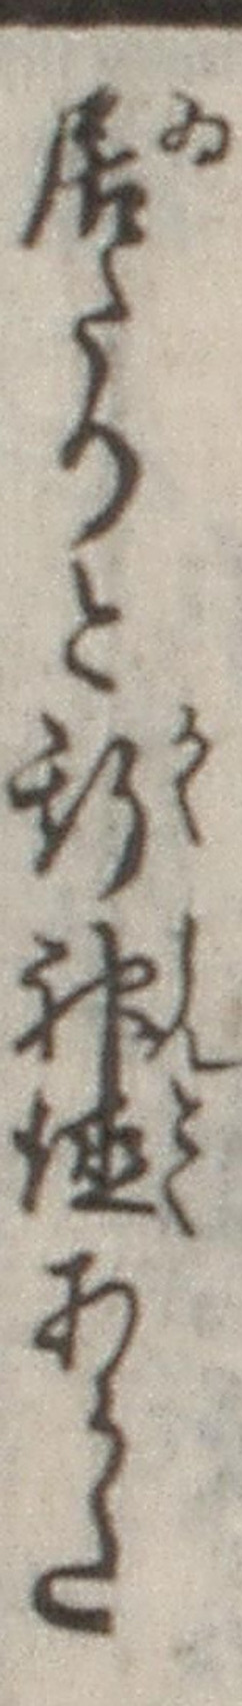居たりと斯神徳あらた
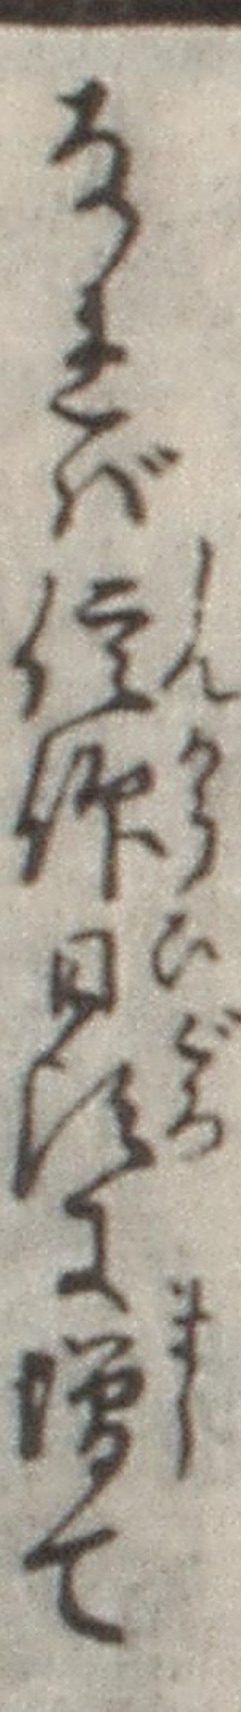なれば信仰日頃に増て
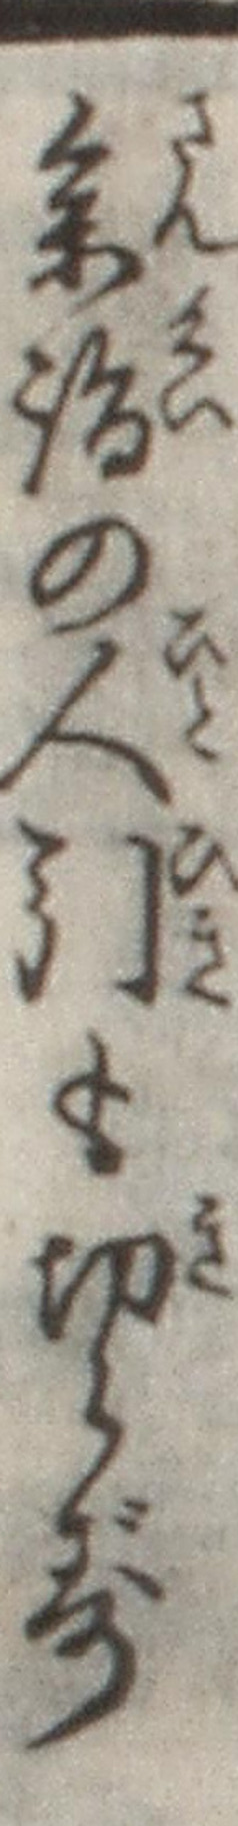参詣の人引も切らず

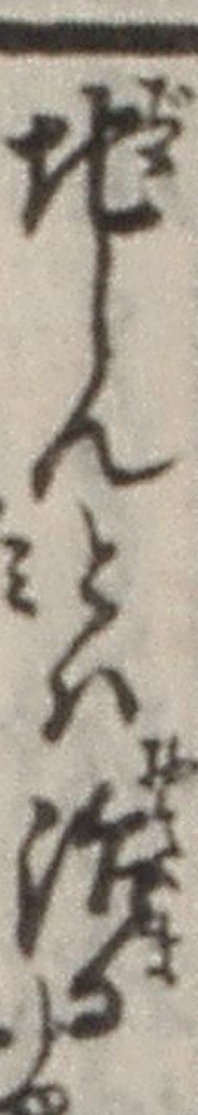地しんとは治る
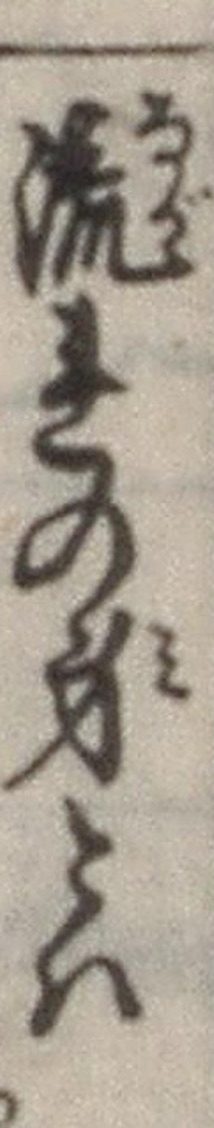流れの身とは
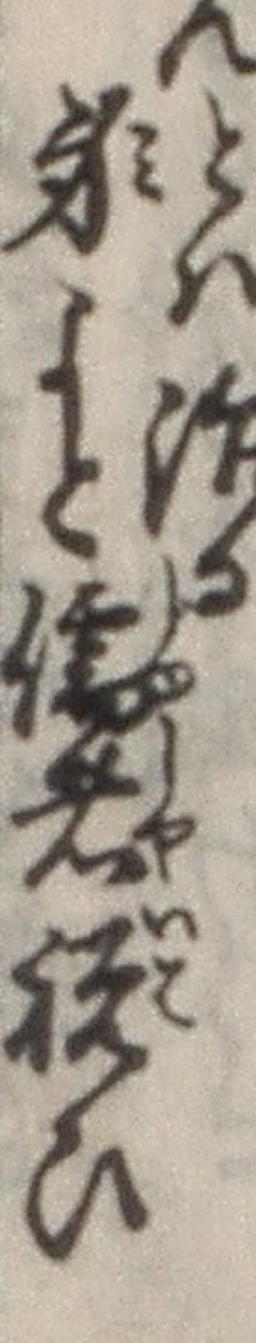身よと儒者祝ひ
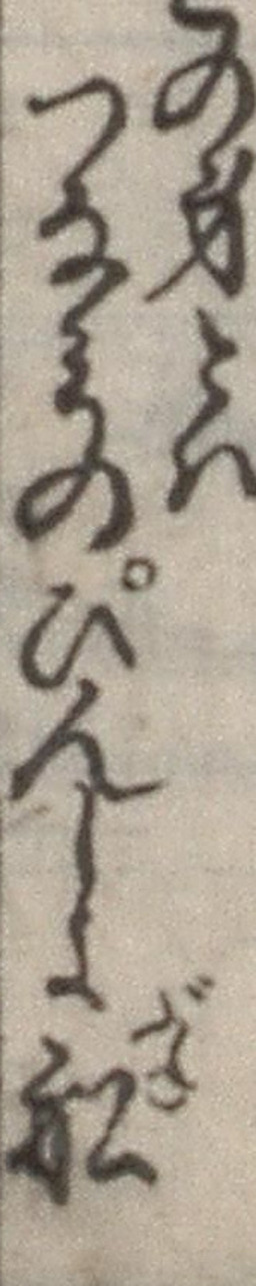つなみのぴんしよ舩
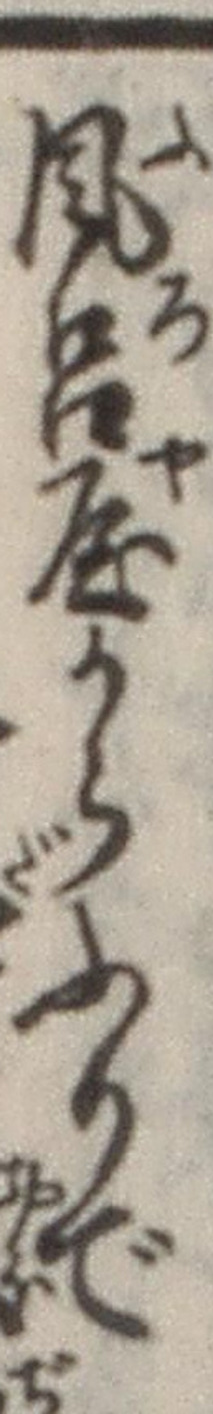風呂屋からふりで
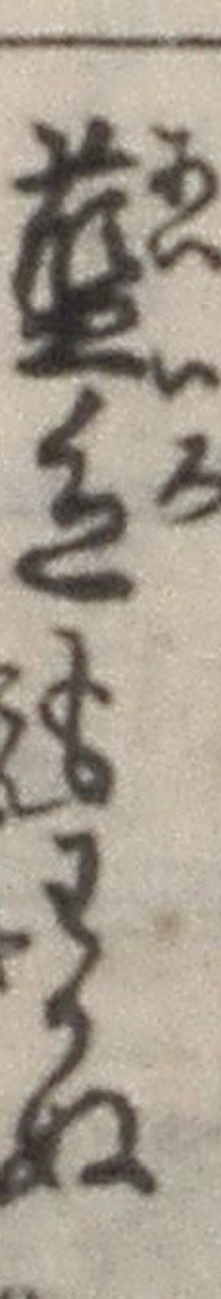藍色もわかぬ
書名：諸國大地震年代記　末代噺種
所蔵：東京大学地震研究所図書室 Earthquake Research Institute Library, The University of Tokyo, JAPAN
